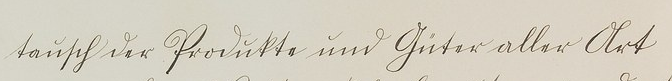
tausch der Produkte und Güter aller Art
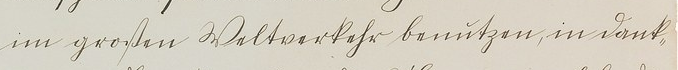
im großen Weltverkehr benutzen, in dank-
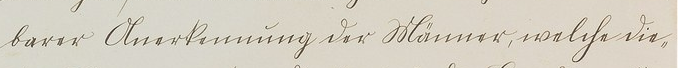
barer Anerkennung der Männer, welche die-
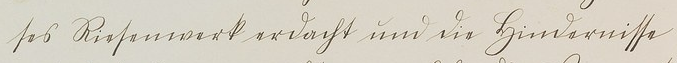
ses Riesenwerk erdacht und die Hindernisse
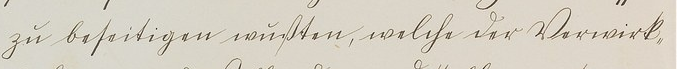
zu beseitigen wußten, welche der Verwirk-
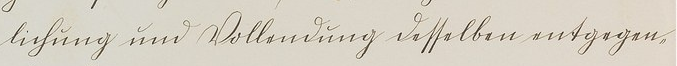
lichung und Vollendung desselben entgegen-
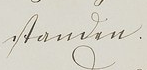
standen.
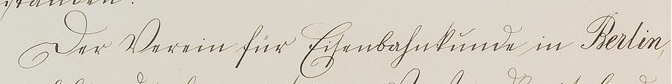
Der Verein für Eisenbahnkunde in Berlin,
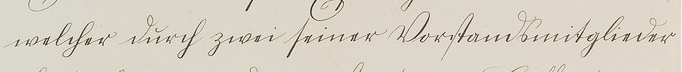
welcher durch zwei seiner Vorstandsmitglieder
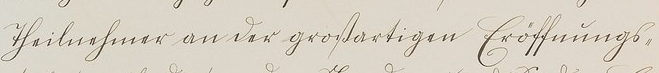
Theilnehmer an der großartigen Eröffnungs-
